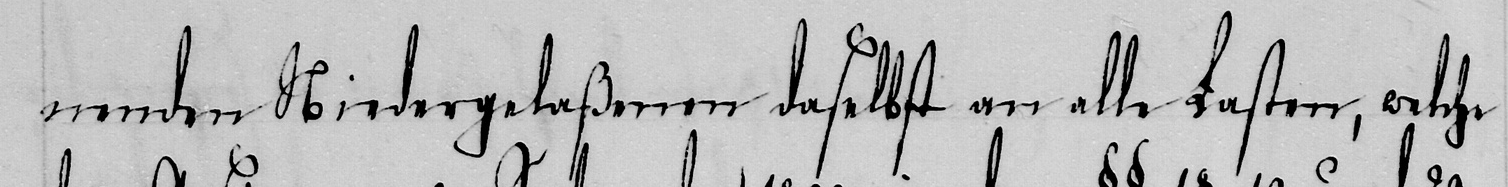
nenden Niedergelaßenen daselbst an alle Lasten, welche
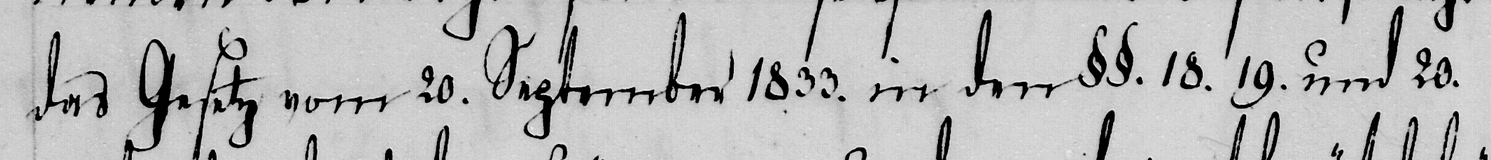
das Gesetz vom 20. September 1833. in den §§. 18. 19. und 20.
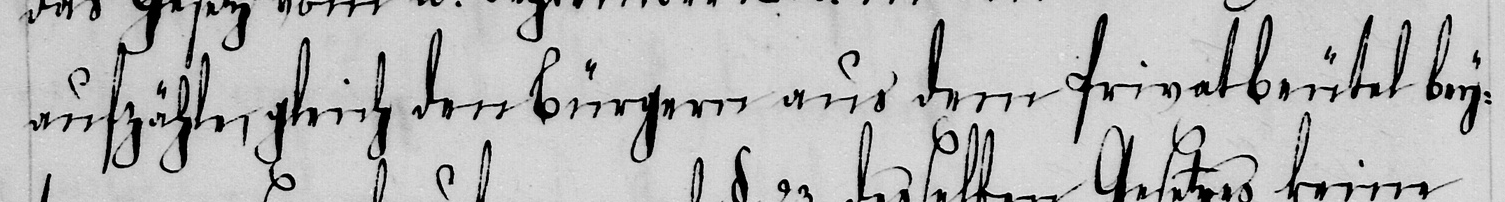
aufzähle, gleich den Bürgern aus dem Privatbeutel be¬
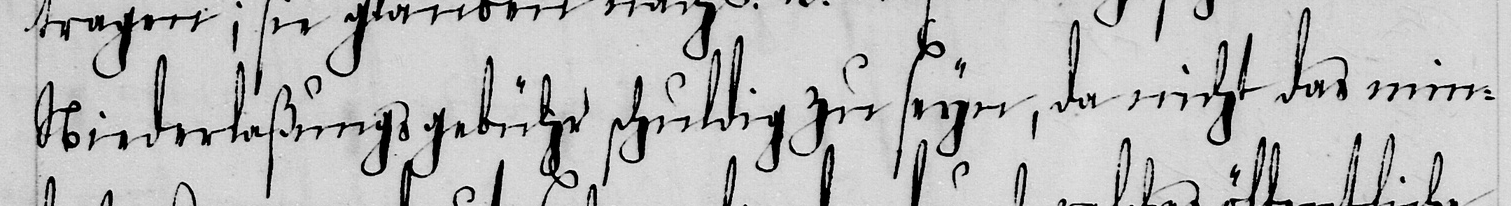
Niederlaßungsgebühr schuldig zu seyn, da nicht das min¬
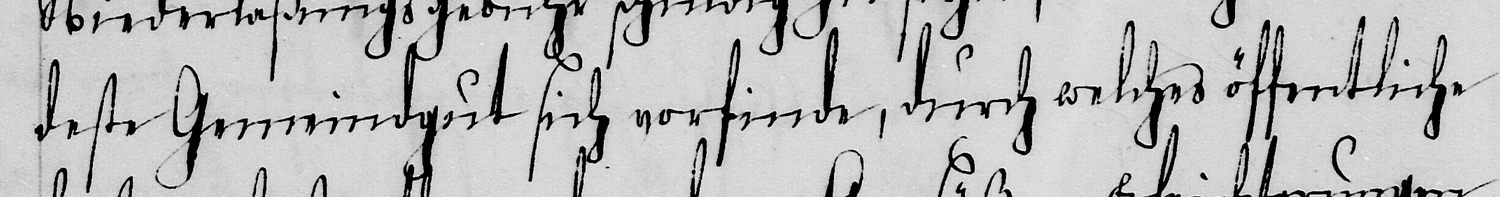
deste Gemeindgut sich vorfinde, durch welches öffentliche
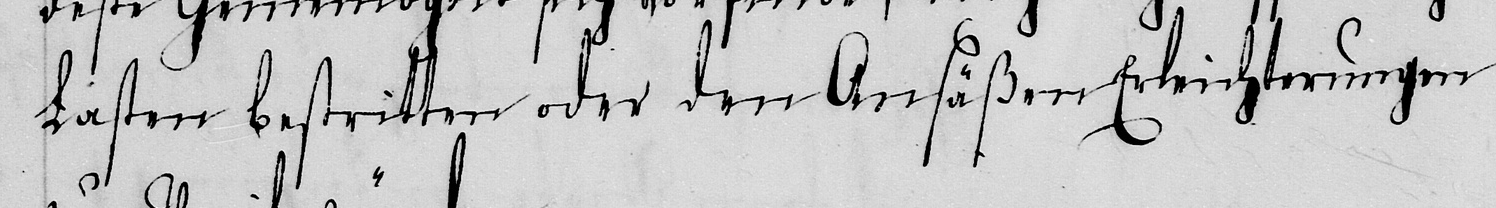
Lasten bestritten oder den Ansäßen Erleichterungen
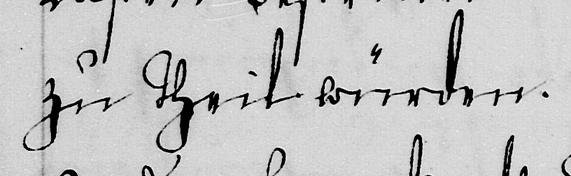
zu Theil würden.
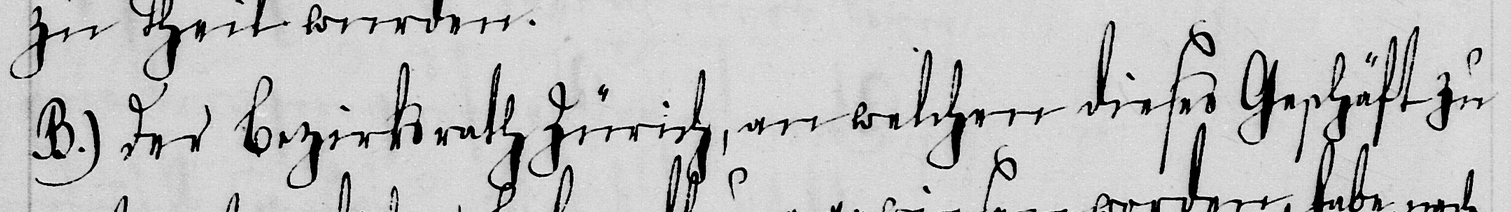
B.) Der Bezirksrath Zürich, an welchen dieses Geschäft zu
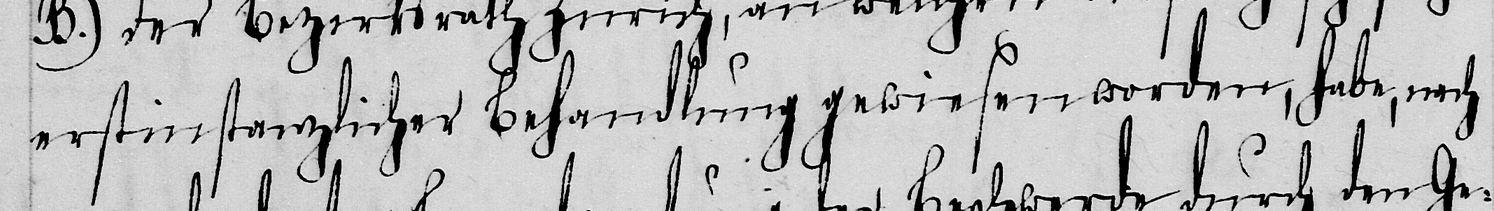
erstinstanzlicher Behandlung gewiesen worden, habe, nach
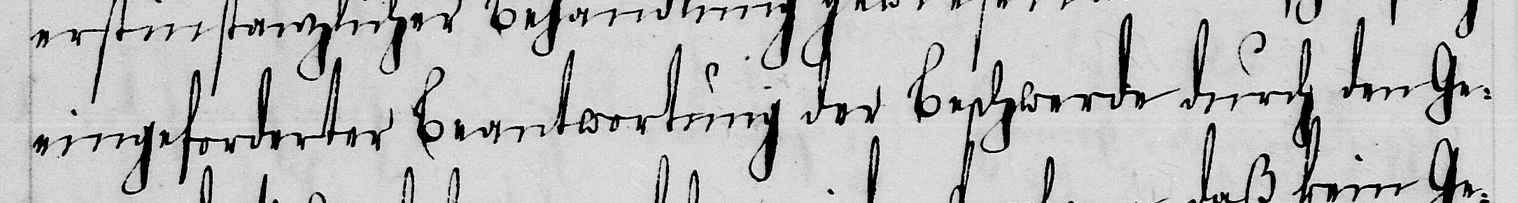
eingeforderter Beantwortung der Beschwerde durch den Ge¬
